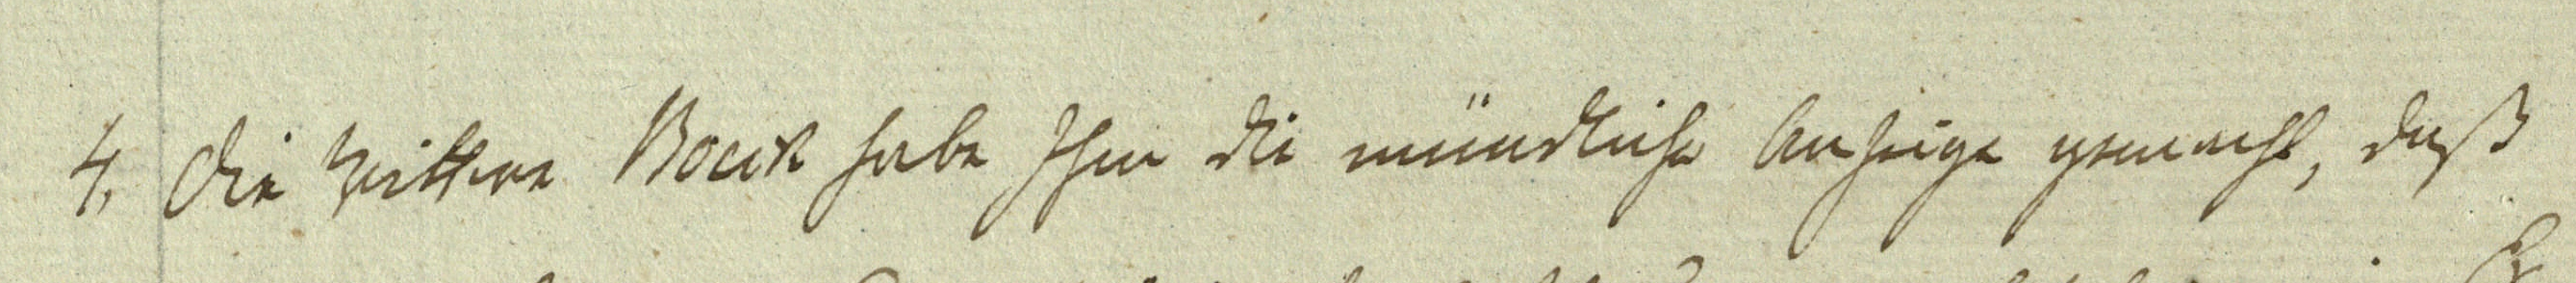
4. Die Wittwe Boeck habe Ihm die mündliche Anzeige gemacht, daß
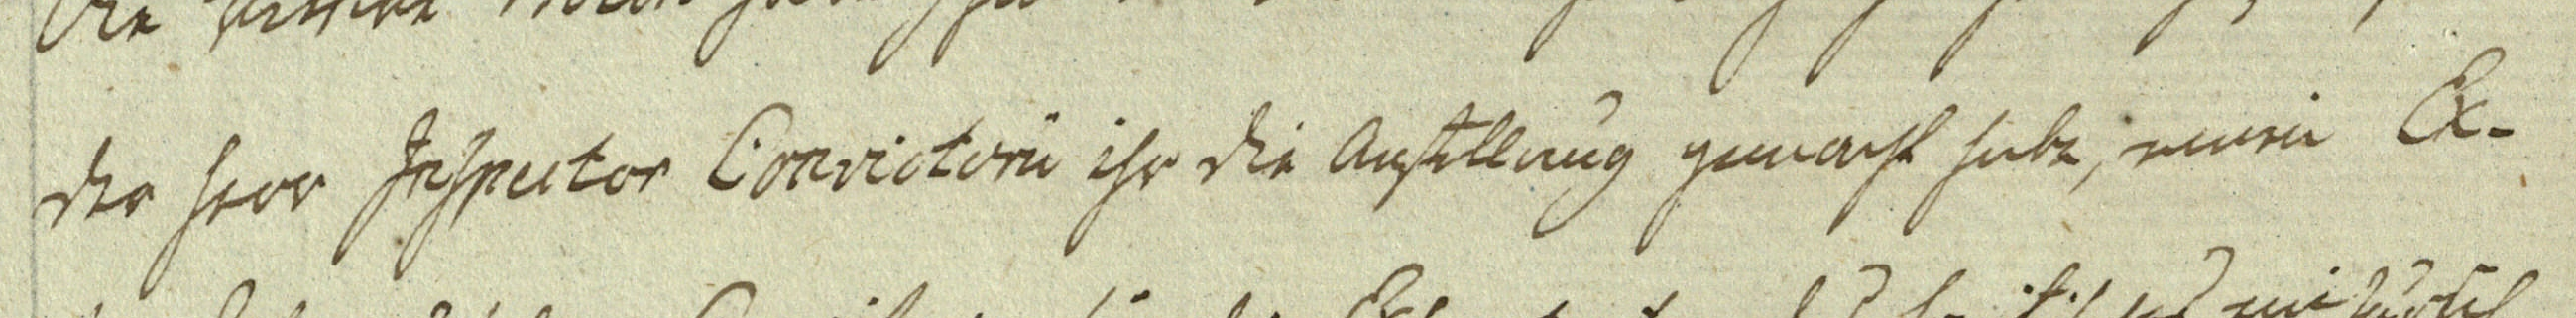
der Herr Inspector Convictorii ihr die Anstellung gemacht habe, einen Ex¬
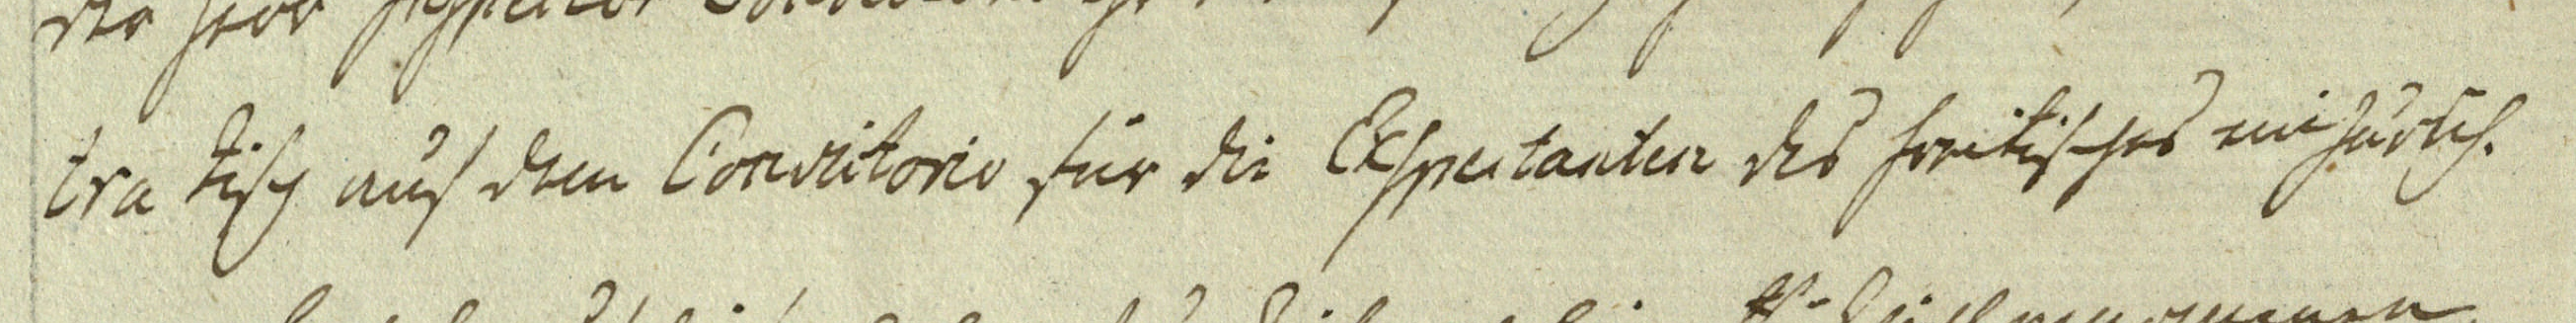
tra Tisch auf dem Convictorio für die Exspectanten des Freitisches einzurich¬
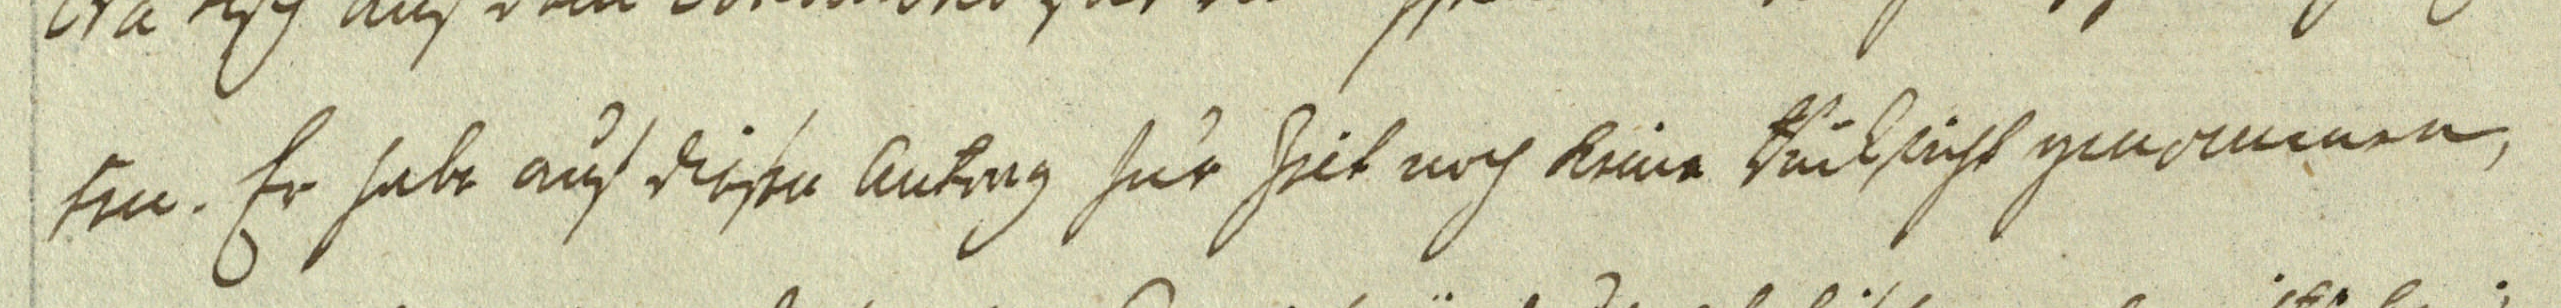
ten. Er habe auf diesen Antrag zur Zeit noch keine Rücksicht genommen,
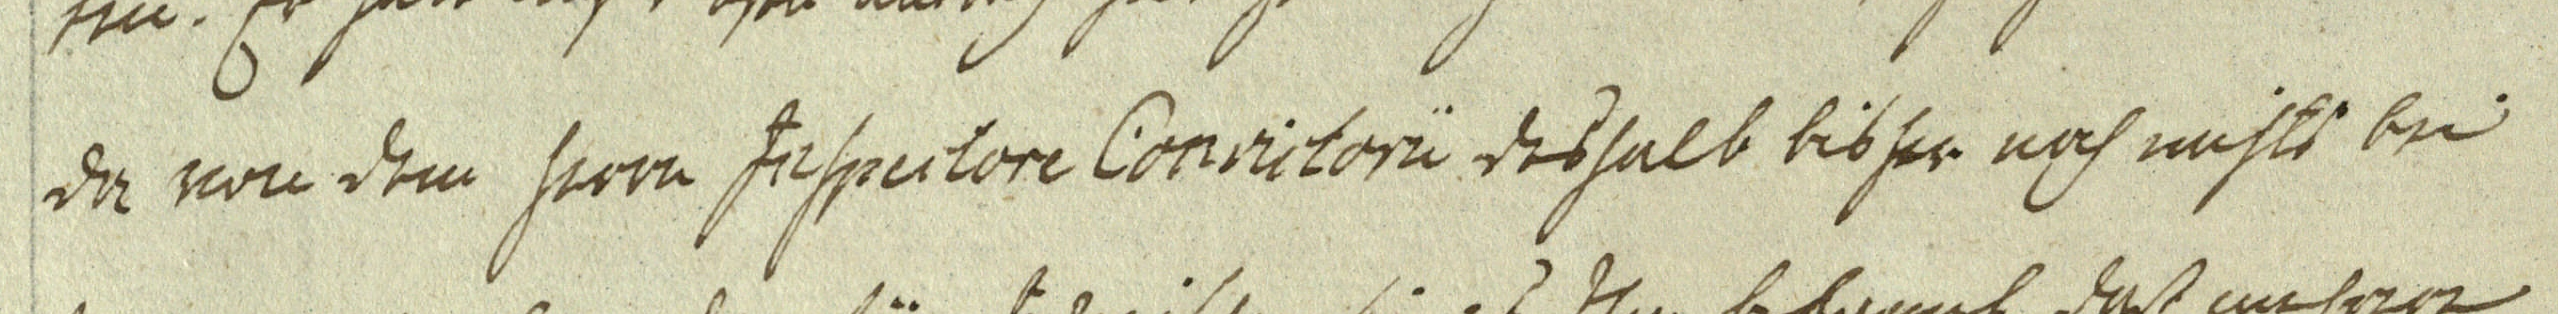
da von dem Herrn Inspectore Convictorii deshalb bisher noch nichts bei
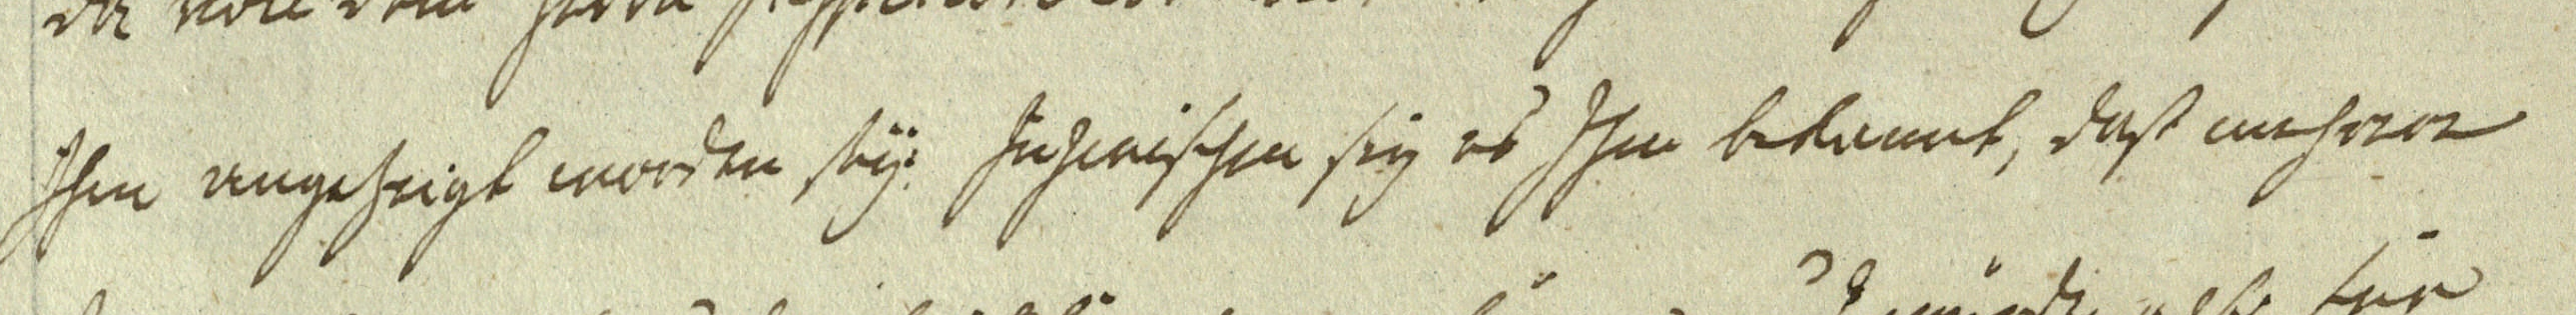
ihm angezeigt worden seÿ. Inzwischen seÿ es Ihm bekannt, daß mehrere
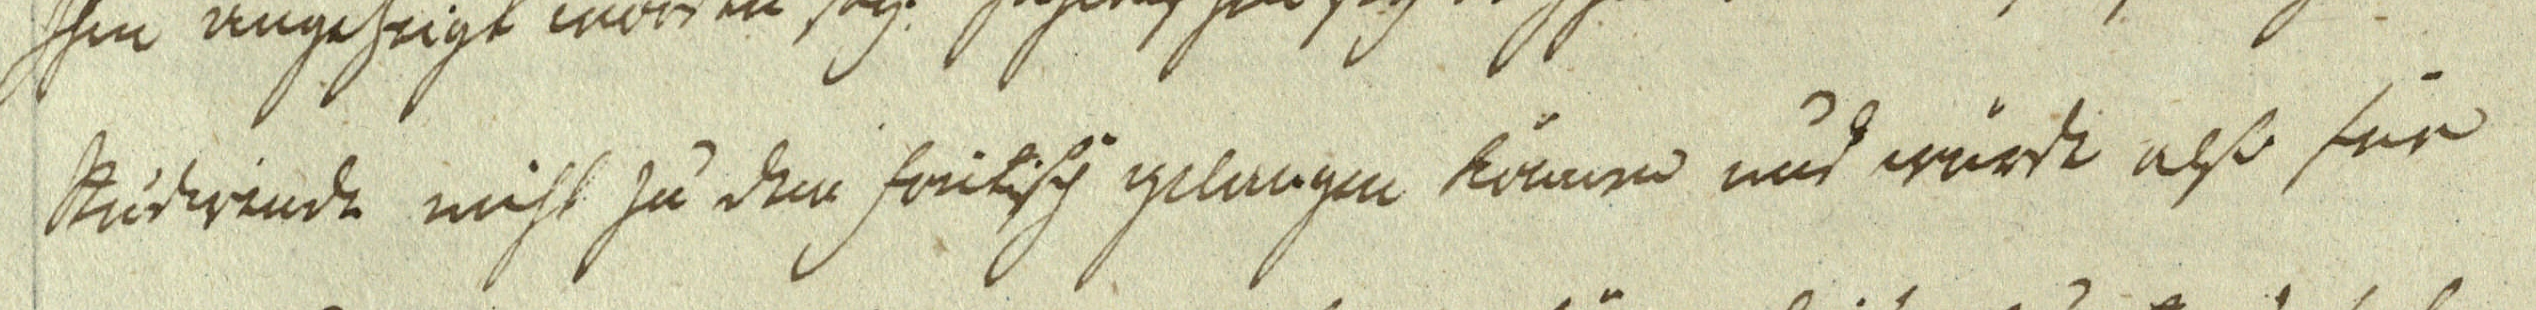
Studirende nicht zu dem Freitisch gelangen können und würde also für
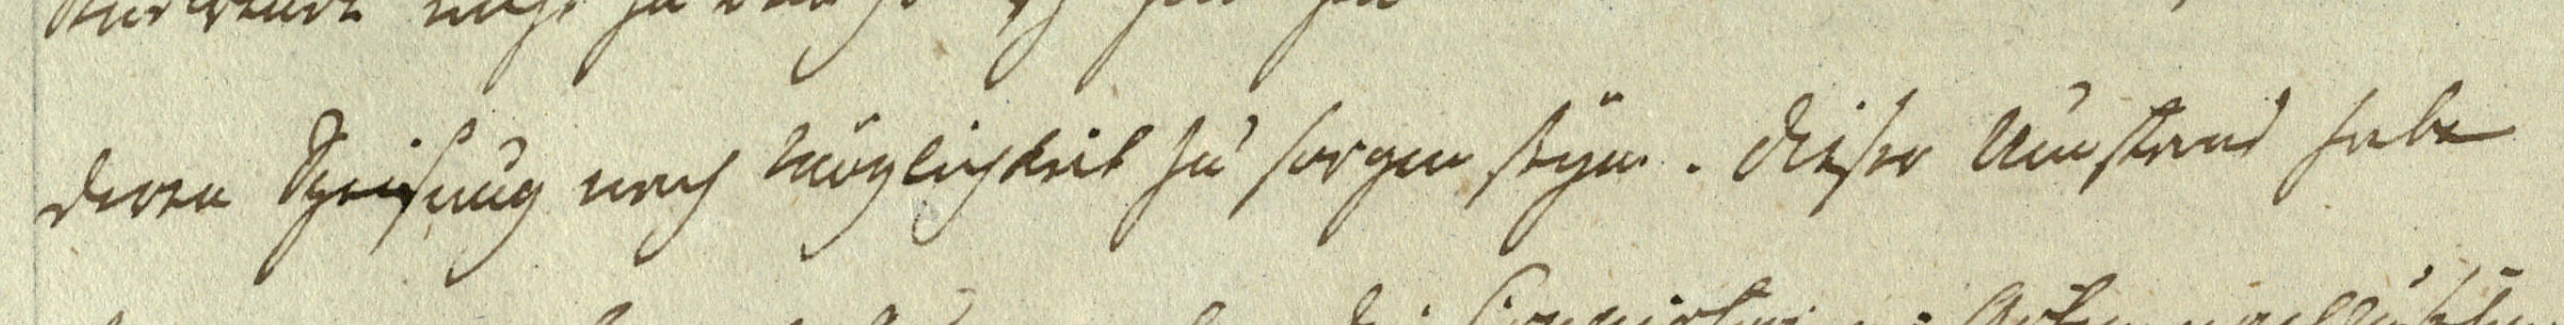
deren Speisung nach Möglichkeit zu sorgen seÿn. Dieser Umstand habe
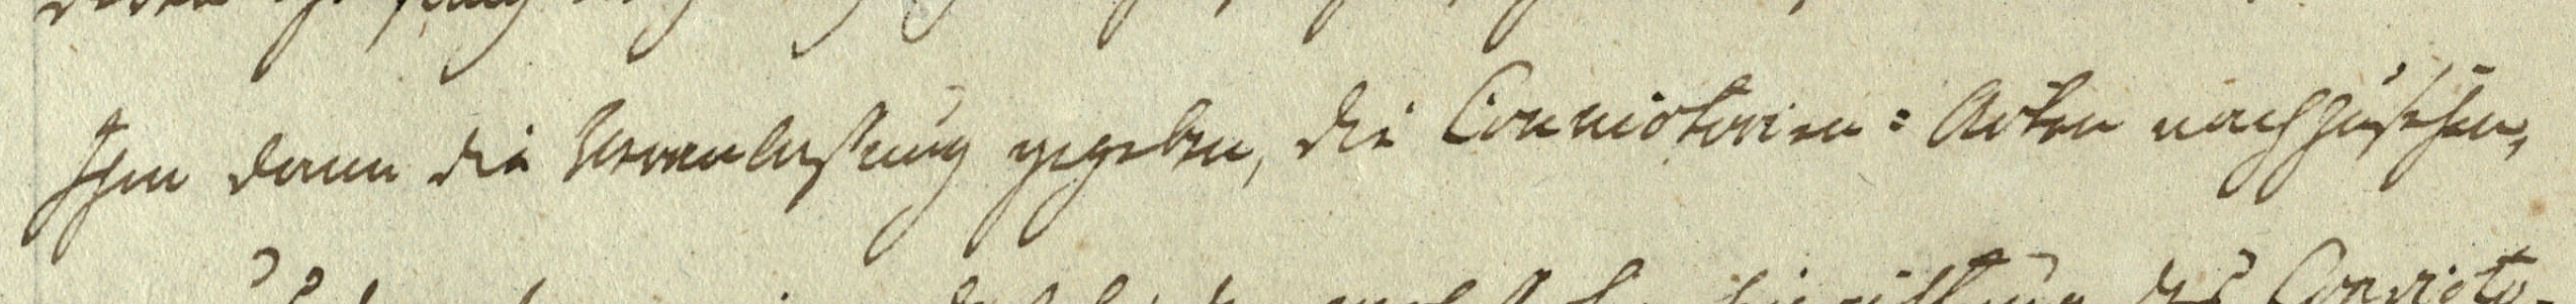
Ihm dann die Veranlassung gegeben, die Convictorien-Acten nachzusehen,
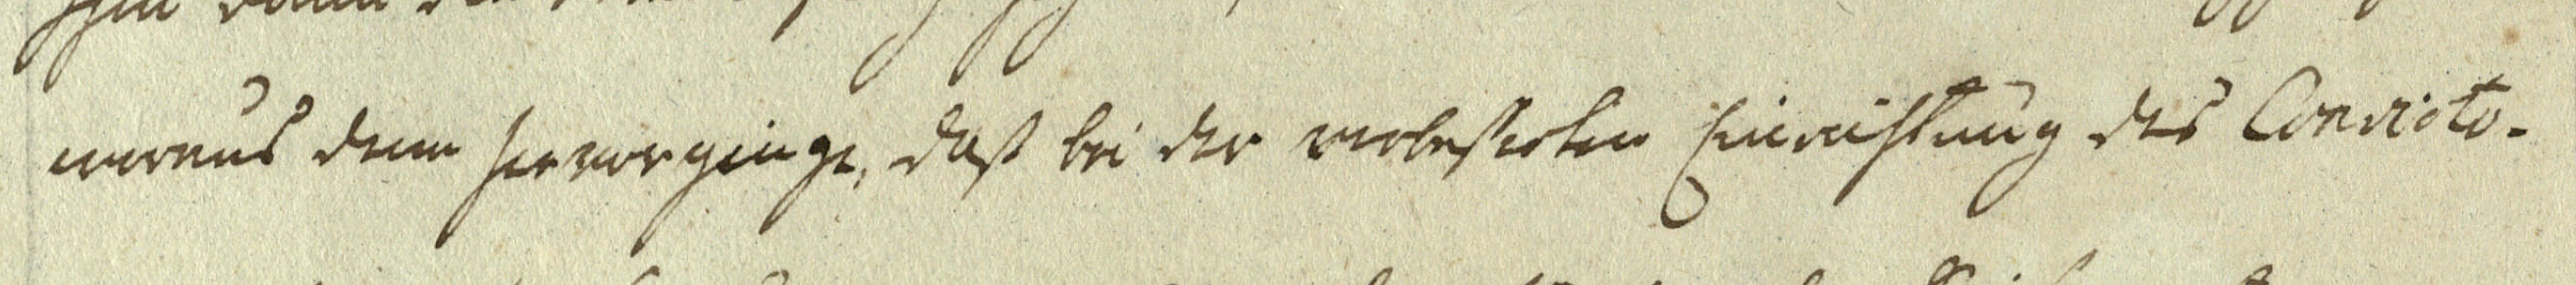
woraus denn hervorginge, daß bei der verbesserten Einrichtung des Convicto¬
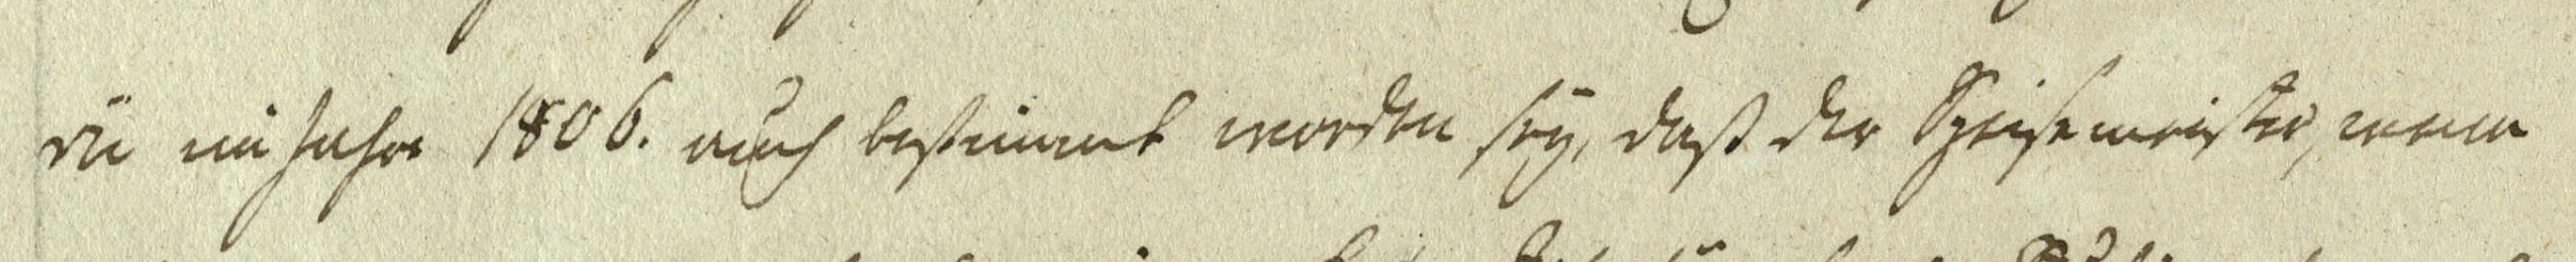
rii im Jahre 1806. auch bestimmt worden seÿ, daß der Speisemeister, wenn
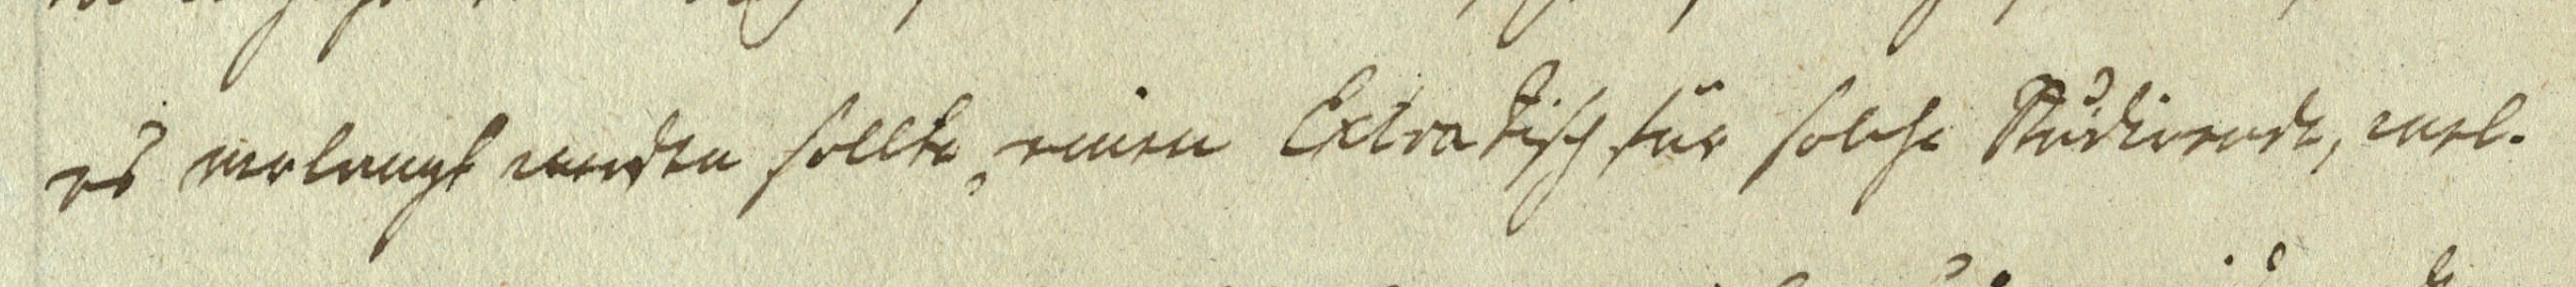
es verlangt worden sollte, einen ExtraTisch für solche Studirende, wel¬
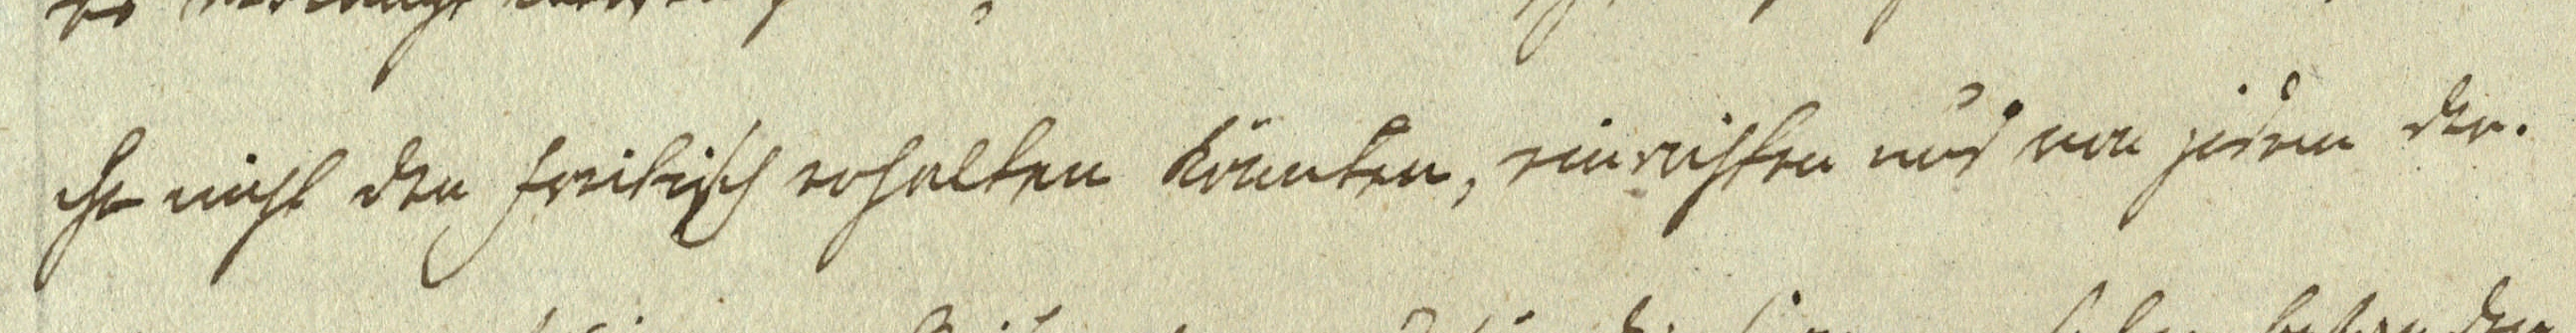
che nicht den Freitisch erhalten könnten, einrichten und von jedem der¬
